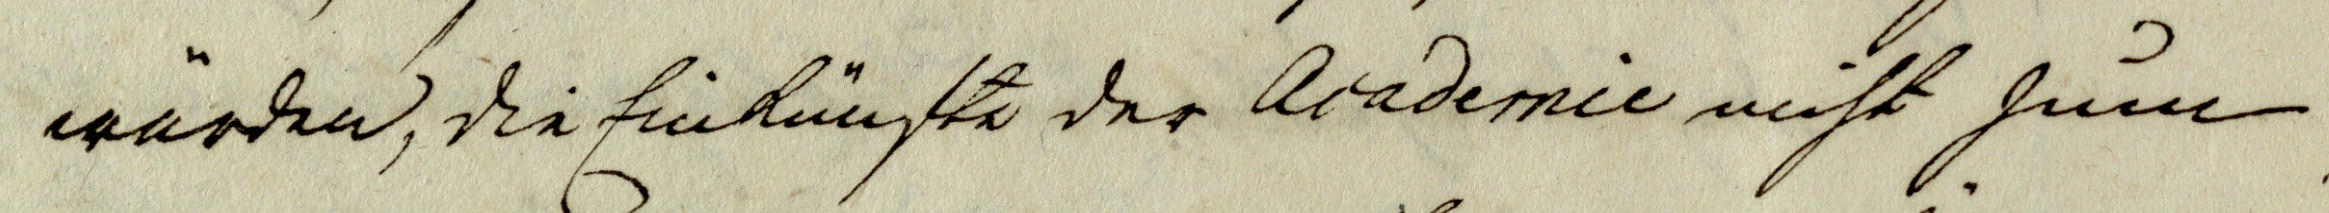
würden, die Einkünfte der Academie nicht zum
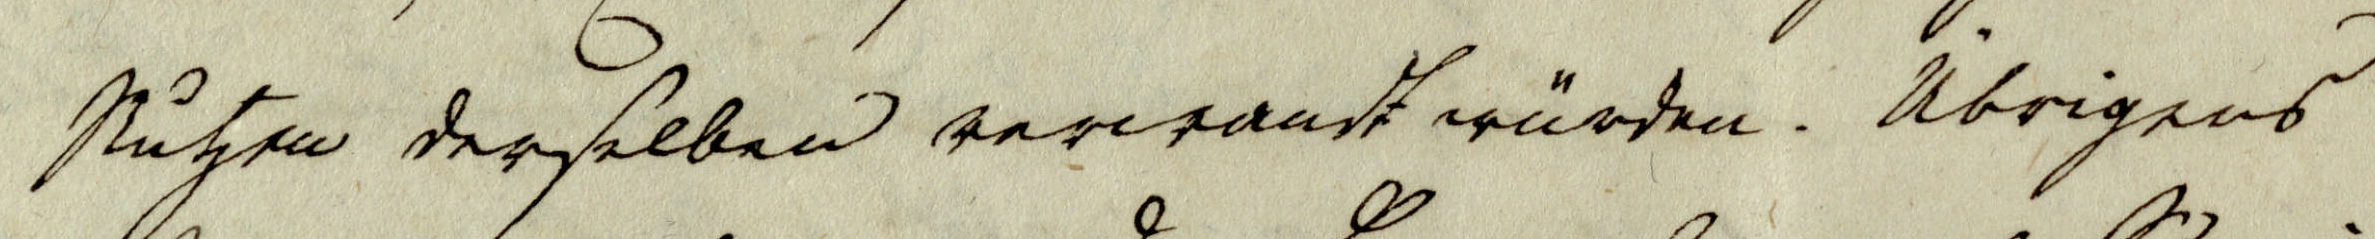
Nutzen derselben verwandt würden. Übrigens
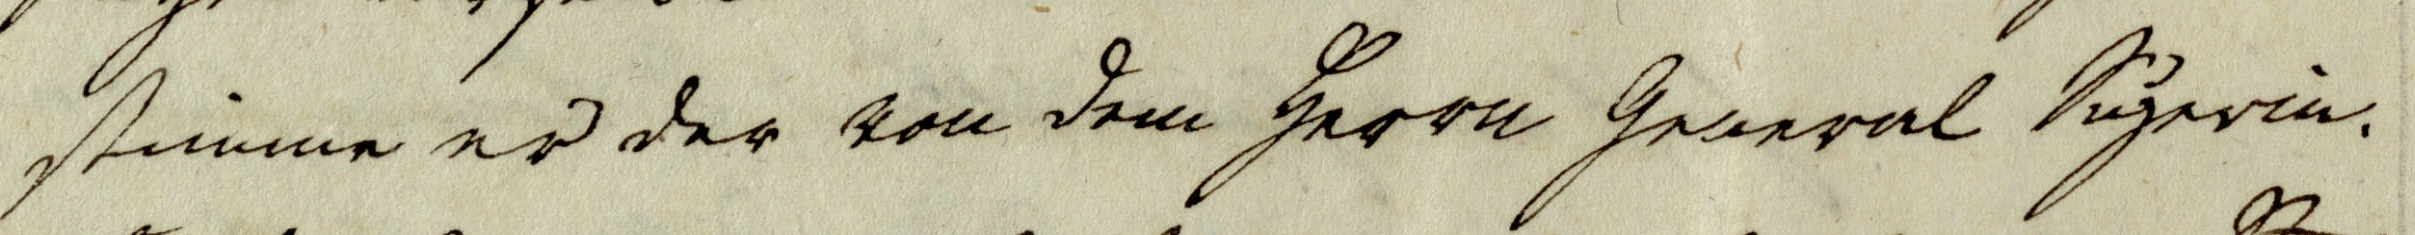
stimme er der von dem Herrn General Superin¬
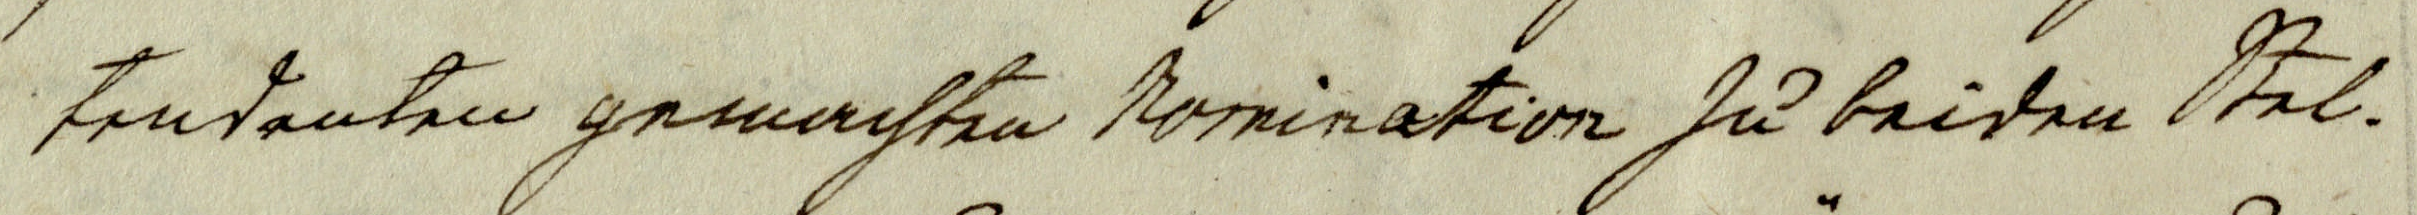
tendenten gemachten Nomination zu beiden Stel¬
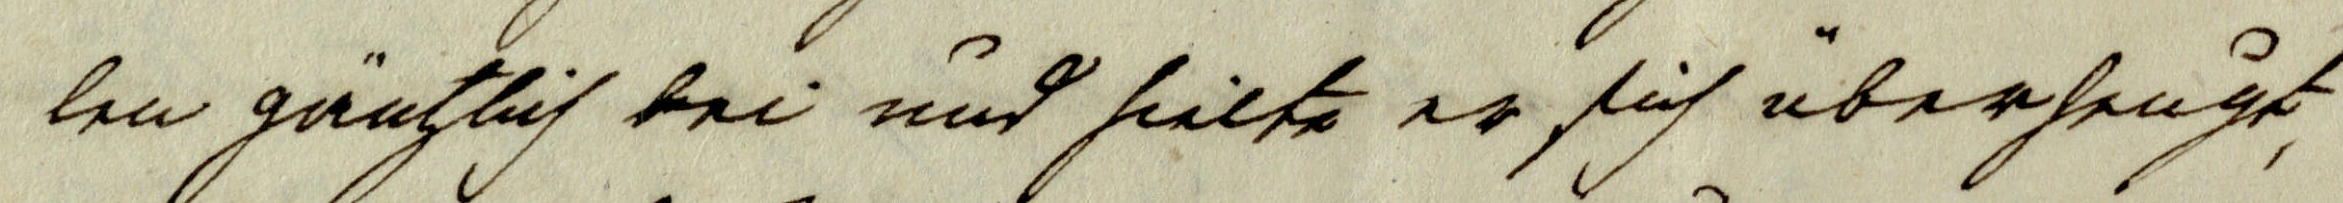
len gäntzlich bei und hielte er sich überhaupt,
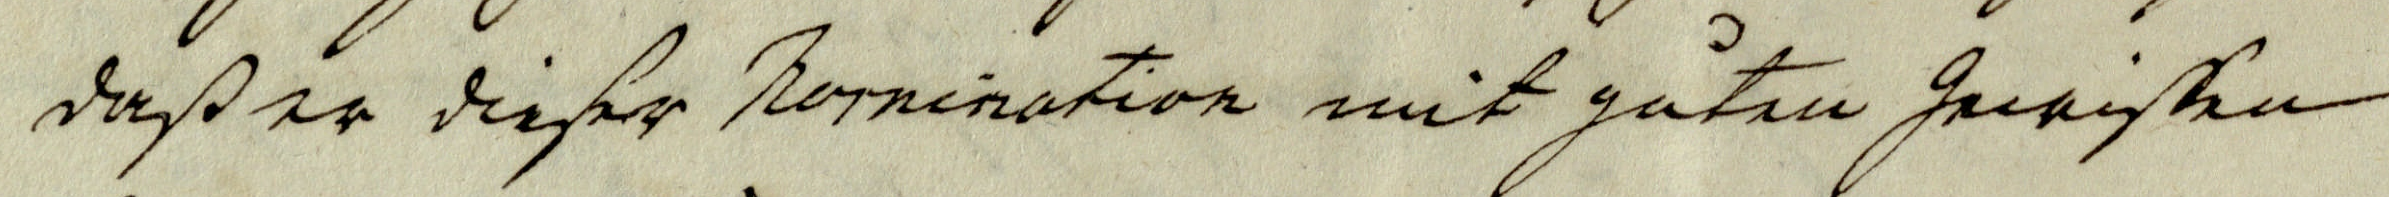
daß er dieser Nomination mit guten Gewissen
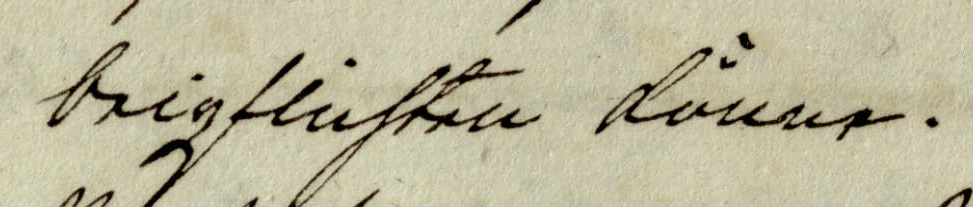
beipflichten könne.
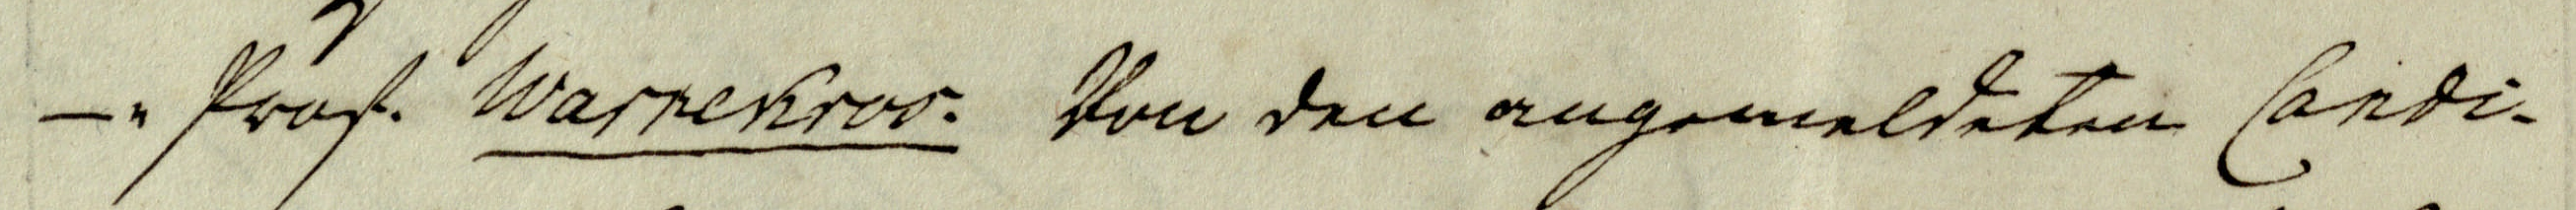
— " Prof. Warneckros. Von den angemeldeten Candi¬
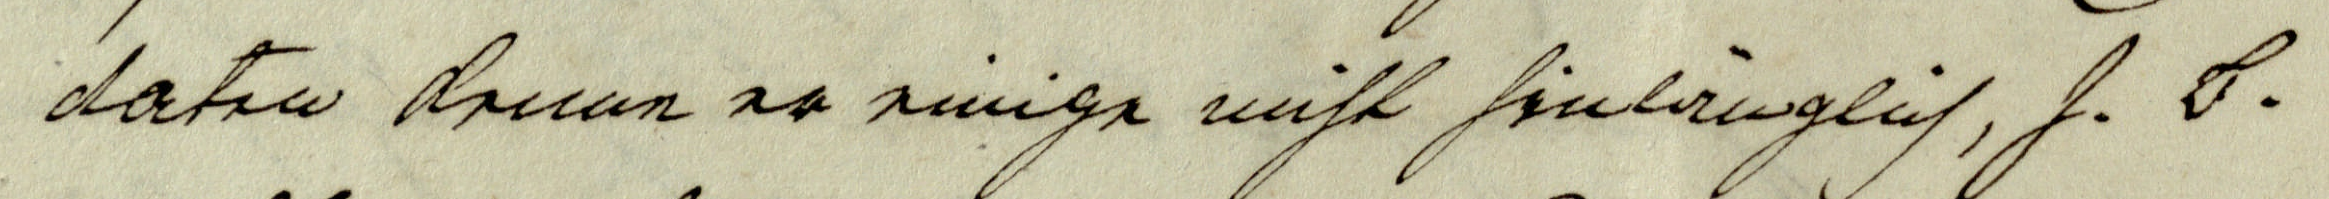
daten kenne er einige nicht hinlänglich, z.B.
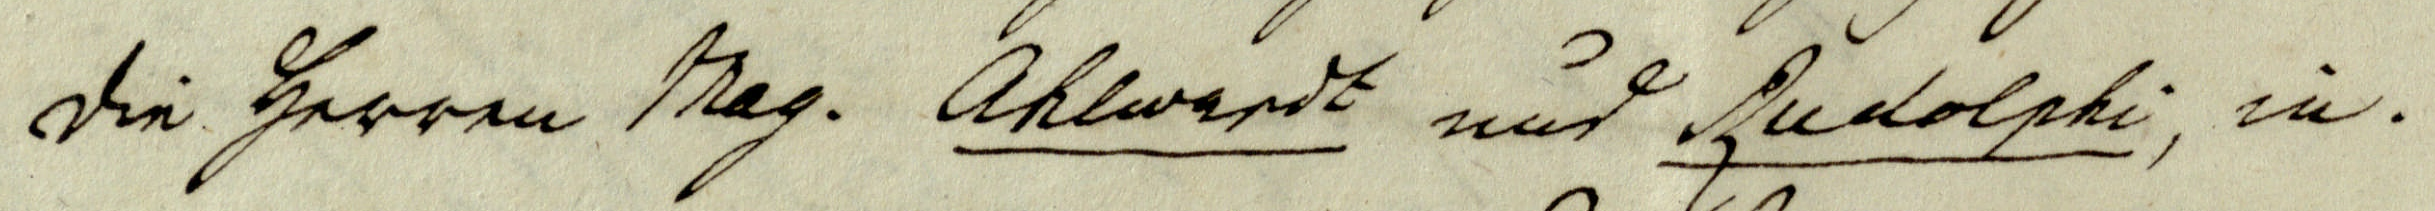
die Herren Mag. Ahlwardt und Rudolphi, in¬
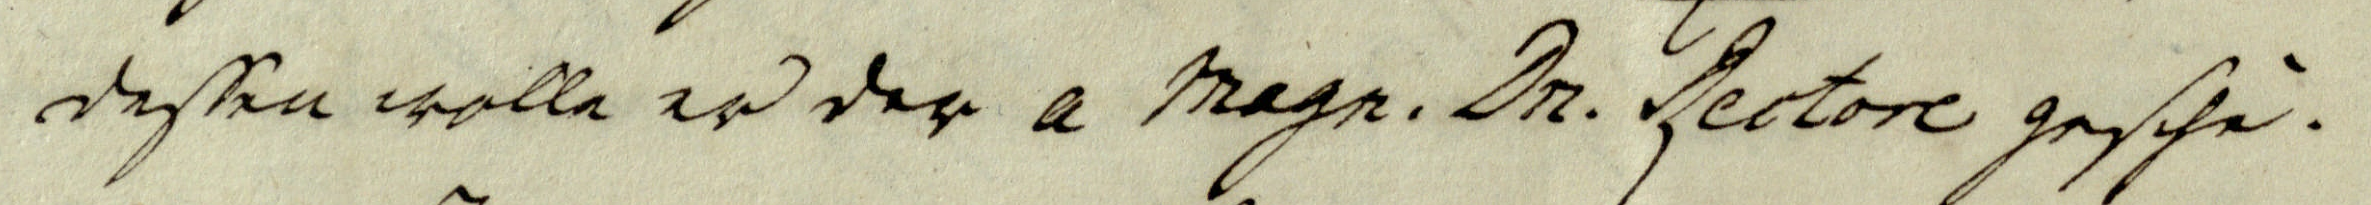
dessen wolle er der a Magn. Dn. Rectore gesche¬
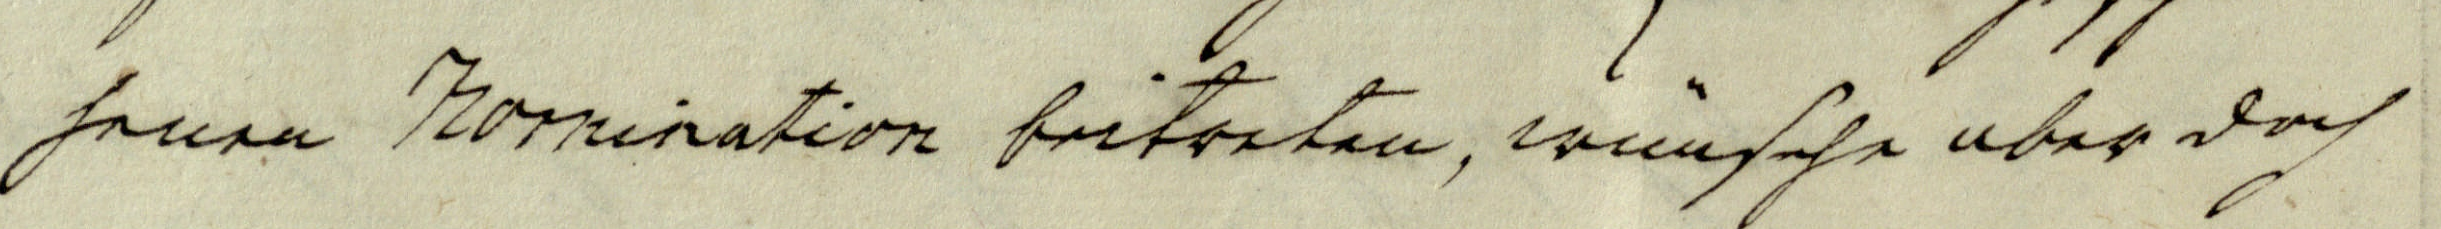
henen Nomination beitreten, wünsche aber doch
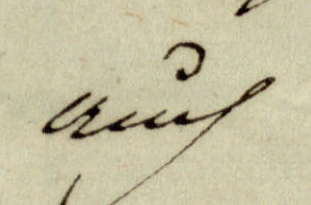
auch
